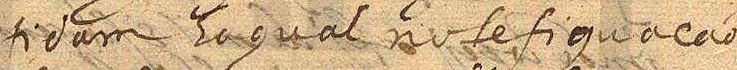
tidam ha qual notefiquacaõ
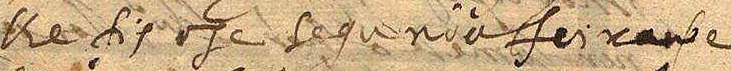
lhe fis oje segunda feira pe
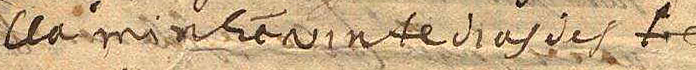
lla menhã vinte dias deste
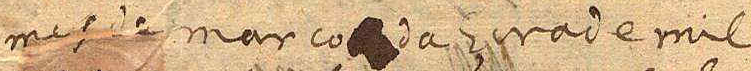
mes de marco da hera de mil
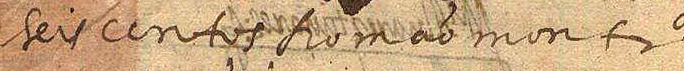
e seiscentos Romaõ montr.o
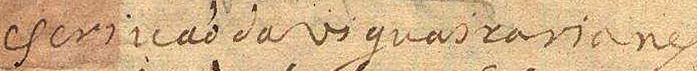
escriuaõ da viguairaria nes
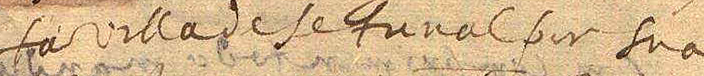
ta villa de setuual por sua
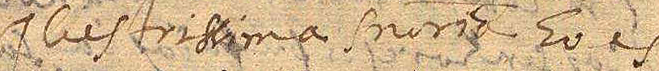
Jlustrissima snor̄ia ho es
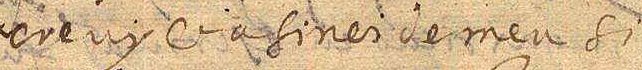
creuy & asinei de meu si
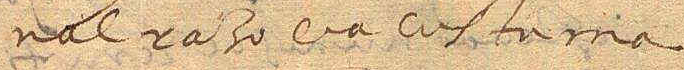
nal razo & acustuma
